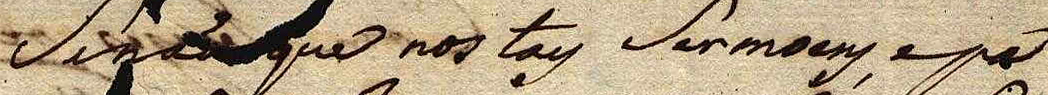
Sendo que nos taes Sermoens, e pa
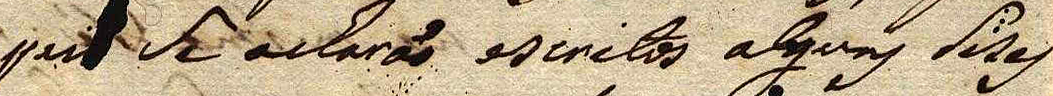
pei_ Se acharaõ escritos alguns deses
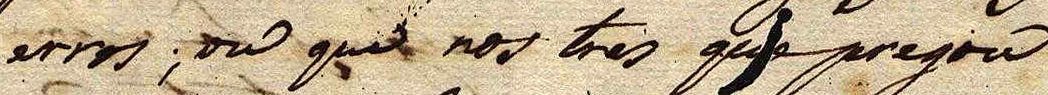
erros; ou que nos tres que pregou
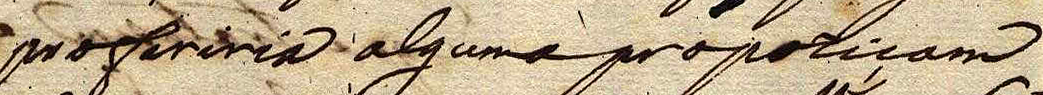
proferiria alguma propoziçam
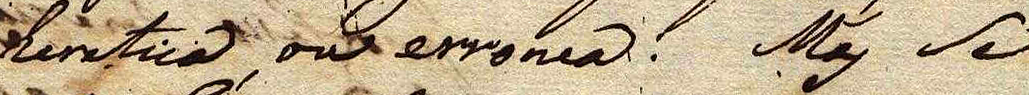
heretica, ou erronea. Más Se
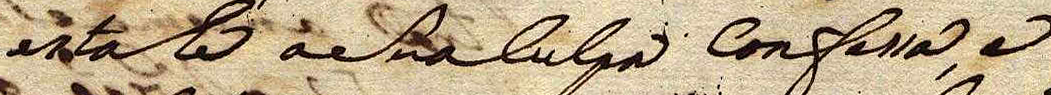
esta he a Sua Culpa Confessa, e
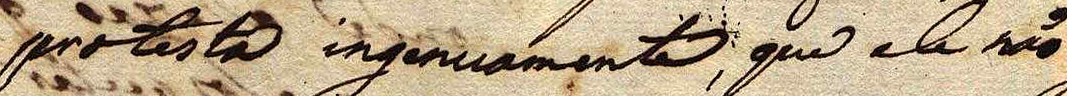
protesta ingenuamente, que ele naõ
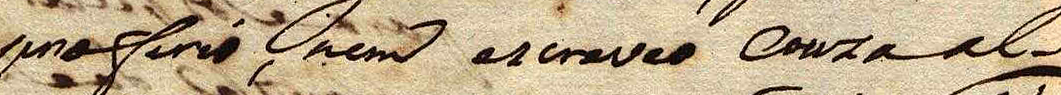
proferio, nem escreveo couza al
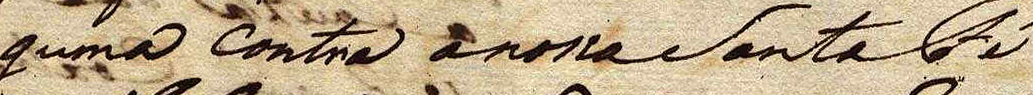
guma contra a nossa Santa Fé
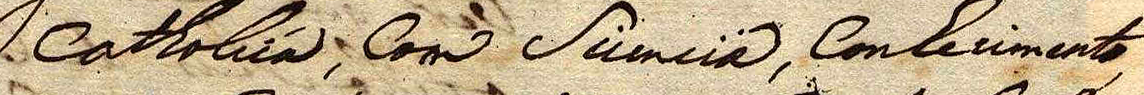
Catholica, Com sciencia, Conhecimento,
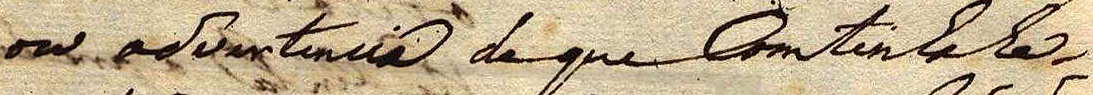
ou advertencia de que Comtinha he
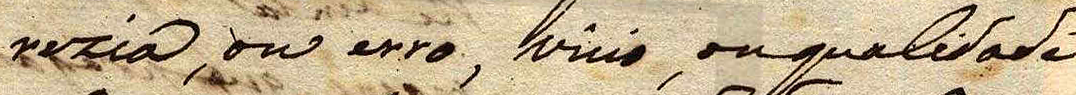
rezia, ou erro, vicio, ou qualidade
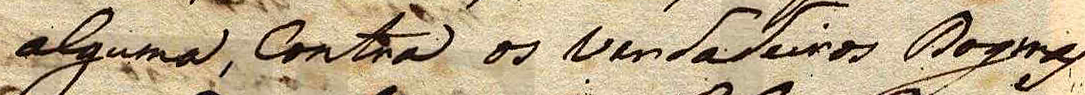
alguma, Contra os verdadeiros Dogmas
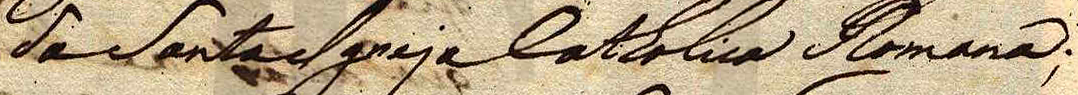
da Santa Igreja Catholica Romana;
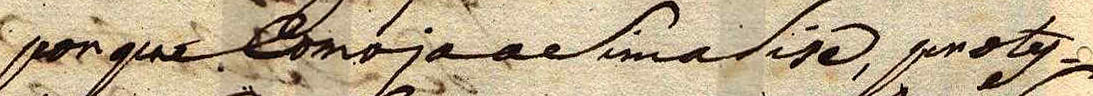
porque Como ja aSima dise, protes
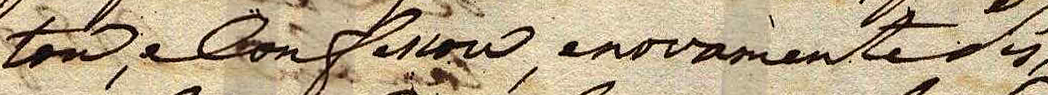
tou, e Confessou, e novamente dis,
